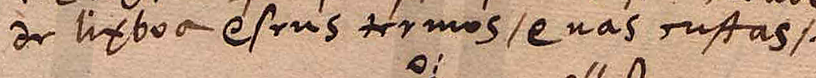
de lixboa e seus termos / e nas custas /.
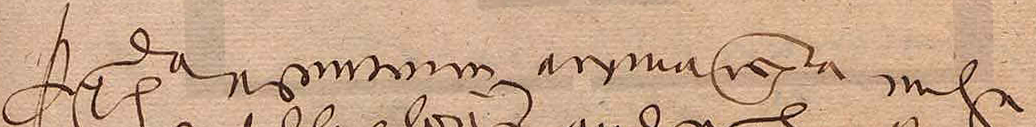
foy p̄da a semtença acyma esp̄ta em ha
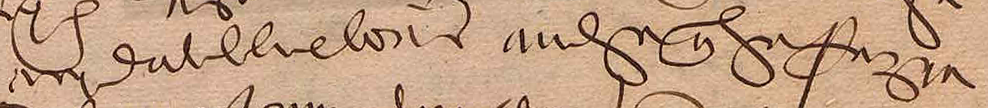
a cydade de lixboa ē audja q̄ hi fazya
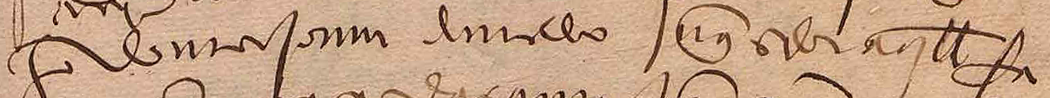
ho doutor Joam de mello Jnq̄sydor a q̄ll fa
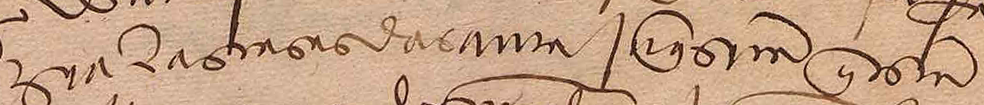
zya ē as casas da santa Jnq̄syçā q̄ estā
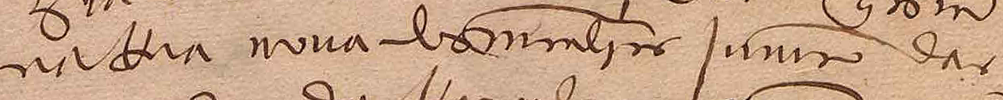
na Rua noua dos mercadores Jumto das
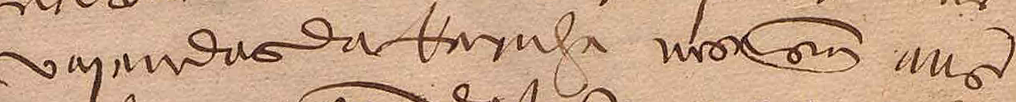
varandas da Raynha nosa s̄ra ausē
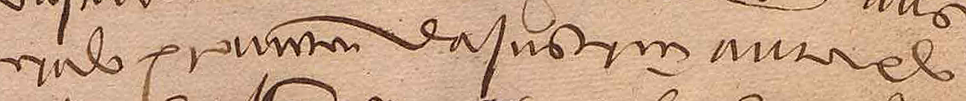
cya do prometor da Justyça autor e do
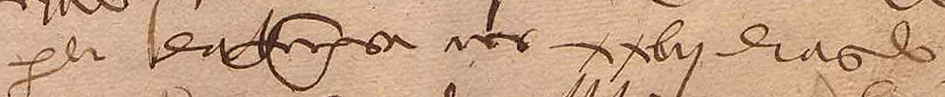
pdor da Ree p̄sa aos xxbij dias do
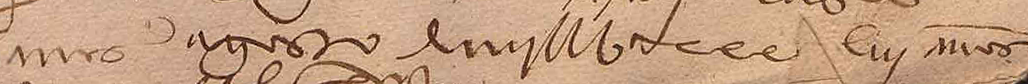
mes dagosto de mjll bc xxx liij ānos
